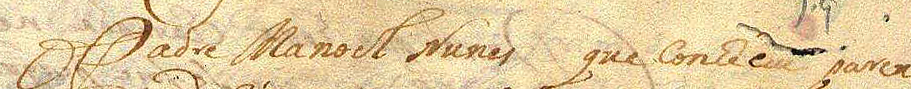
O Padre Manoel Nunes que conheceu paren
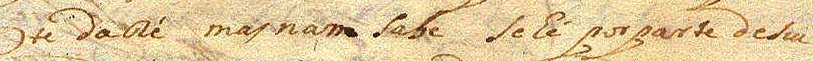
te da Ré mas nam sabe se hé por parte de seu
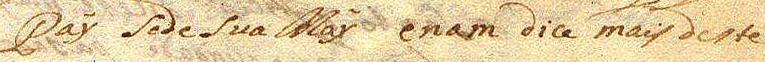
Pay se de sua Maỹ e nam dice mais deste
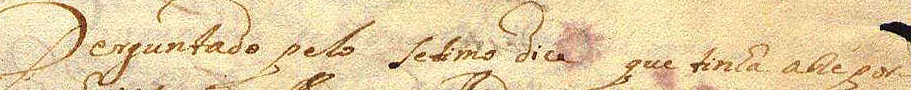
Perguntado pelo Setimo dice que tinha a Ré por
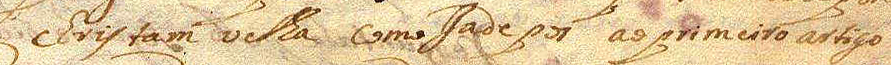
christam velha como Ja depos ao primeiro artigo
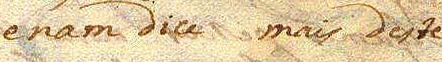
e nam dice mais deste
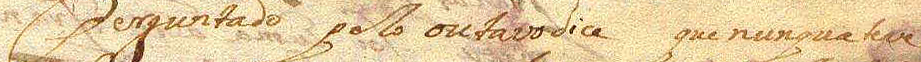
Perguntado pelo outavo dice que nunqua teve
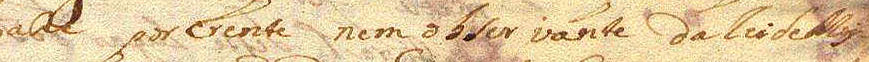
a Re por crente nem observante da lei de Moy
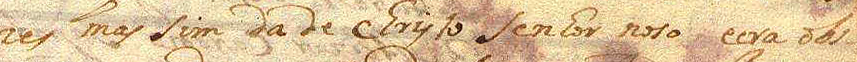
zes mas sim da de christo Senhor noso e era obs
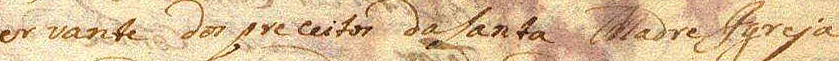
ervante dos preceitos da Santa Madre Jgreja
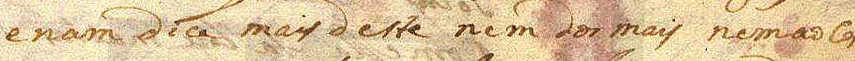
e nam dice mais deste nem dos mais nem ao cos
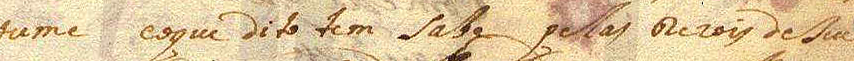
tume e o que tem sabe pelas Rezois de seu
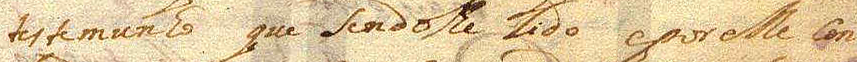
testemunho que sendolhe lido e por elle con
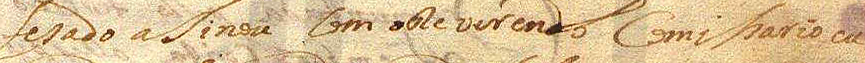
fesado aSinou com o Reverendo Comissario eu
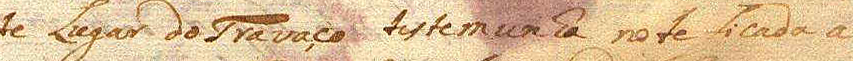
te Lugar do Travaço testemunha noteficada a
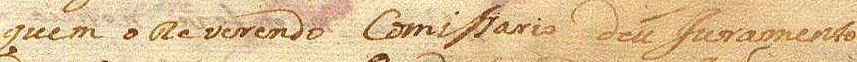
quem o Reverendo Comissario deu Juramento
